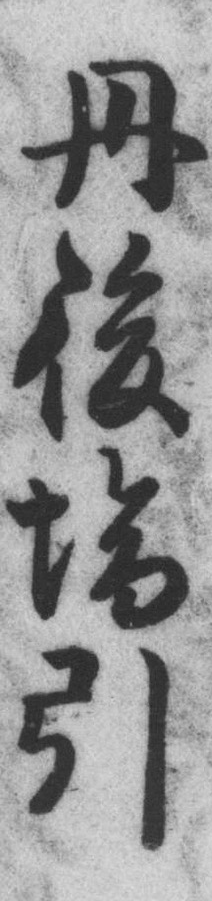丹後塩引
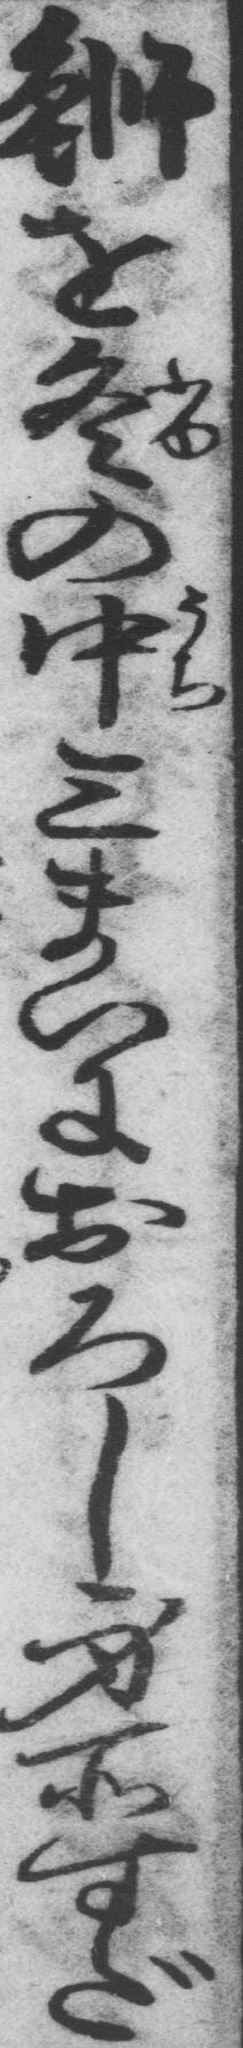鰤を冬の中三まいにおろし身所すだ
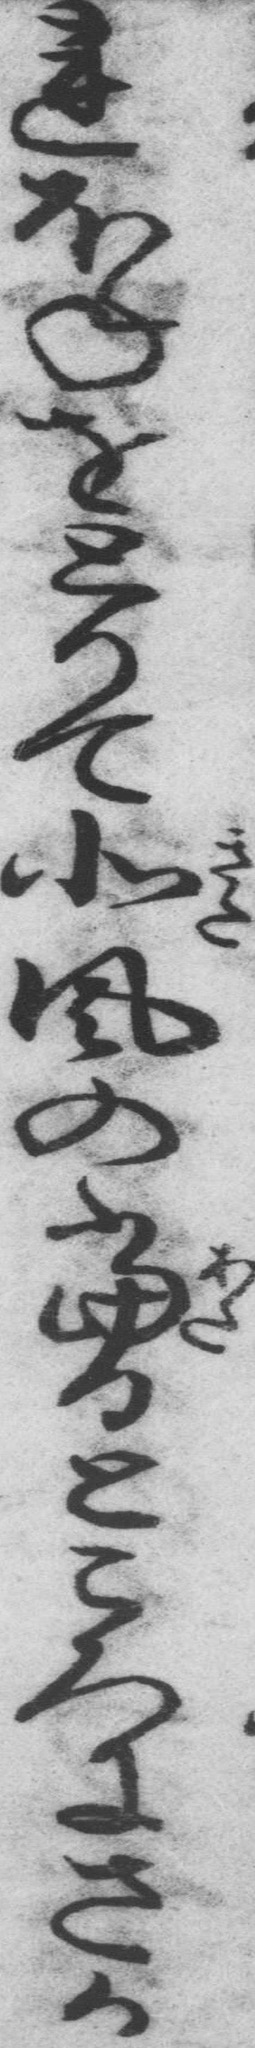れほねをとりて北風の当るところにさか
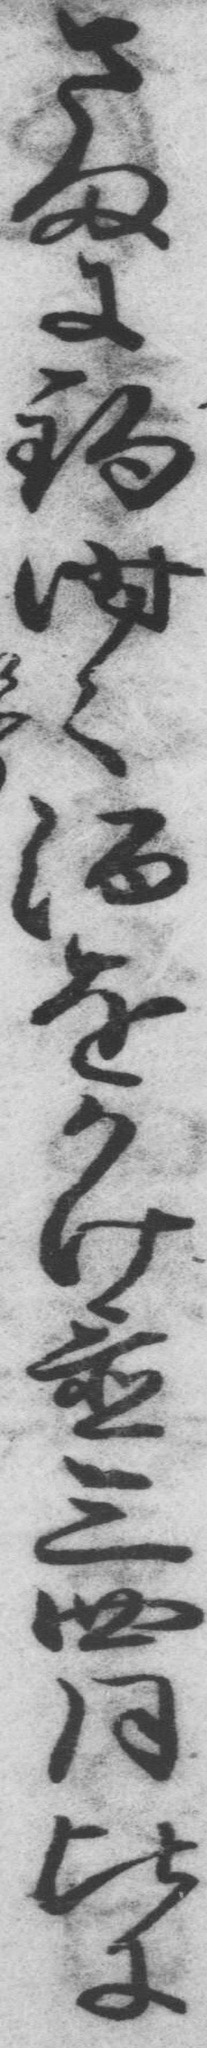さまに釣時々酒をかけ置三四月比に
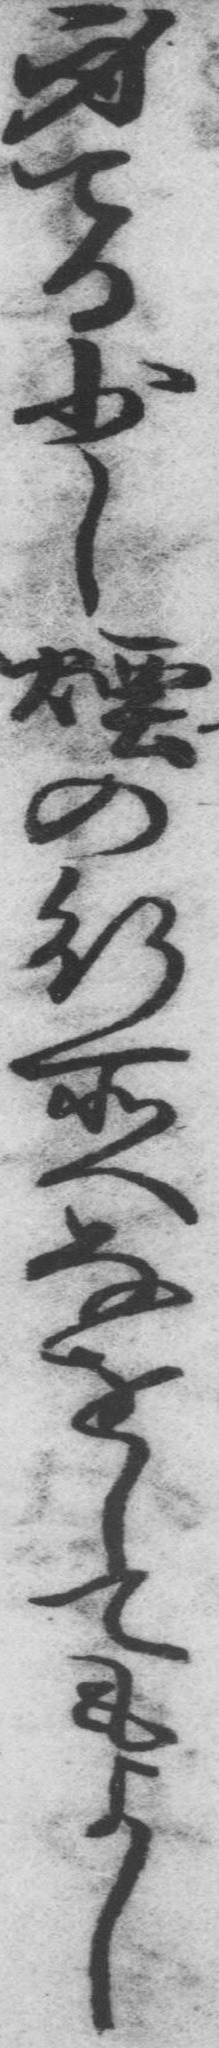身てる少し煙の行所へなをしてもよし
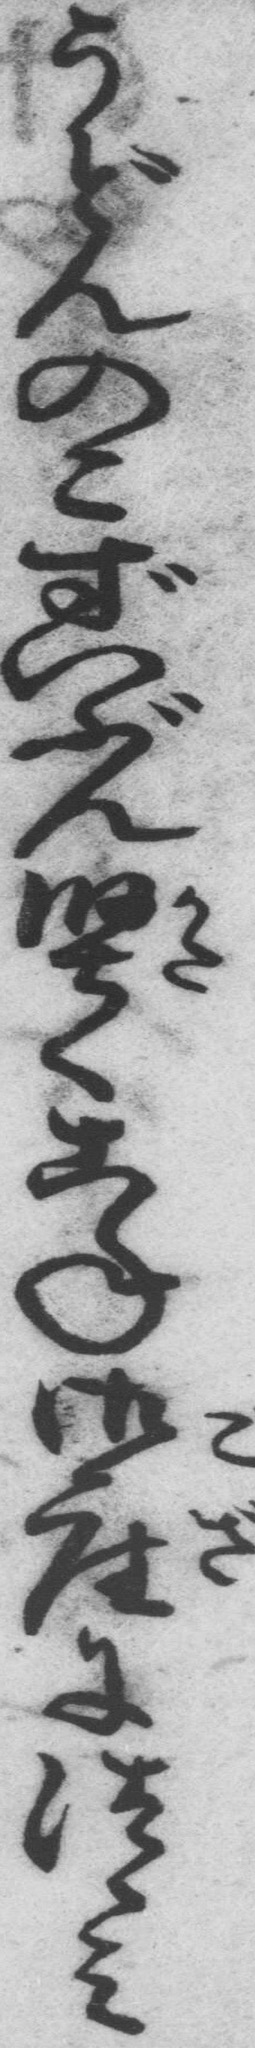うどんのこすいぶん堅くこね御座につゝみ
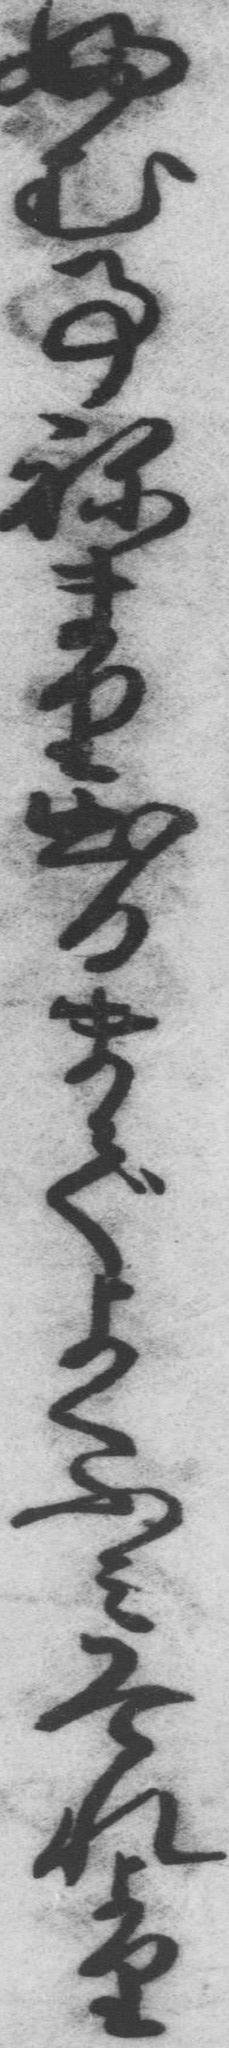ふむ事ねまり出るまでよくふみそれより
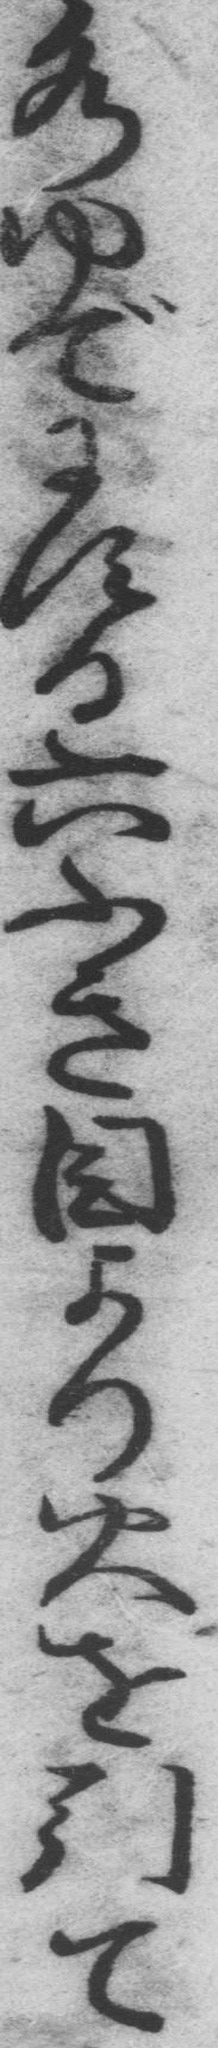水ゆでにする六ふき目より火を引て

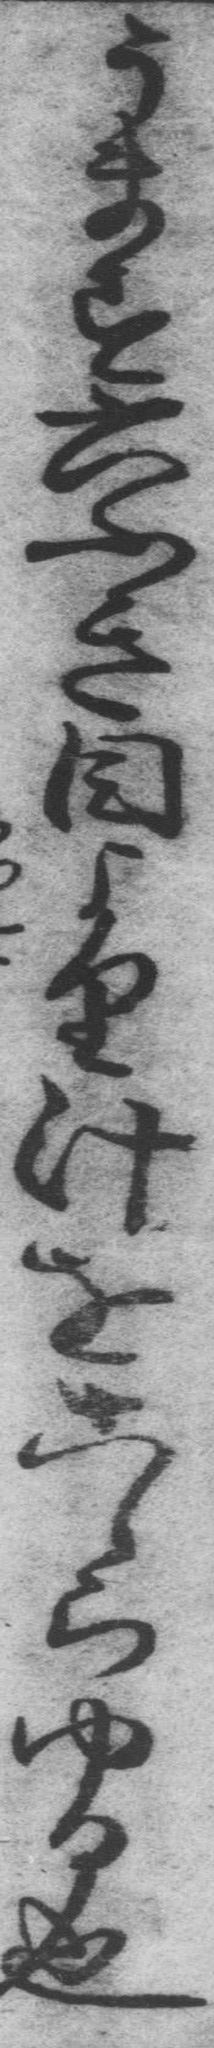うます六ふき目より汁をこしらゆる也
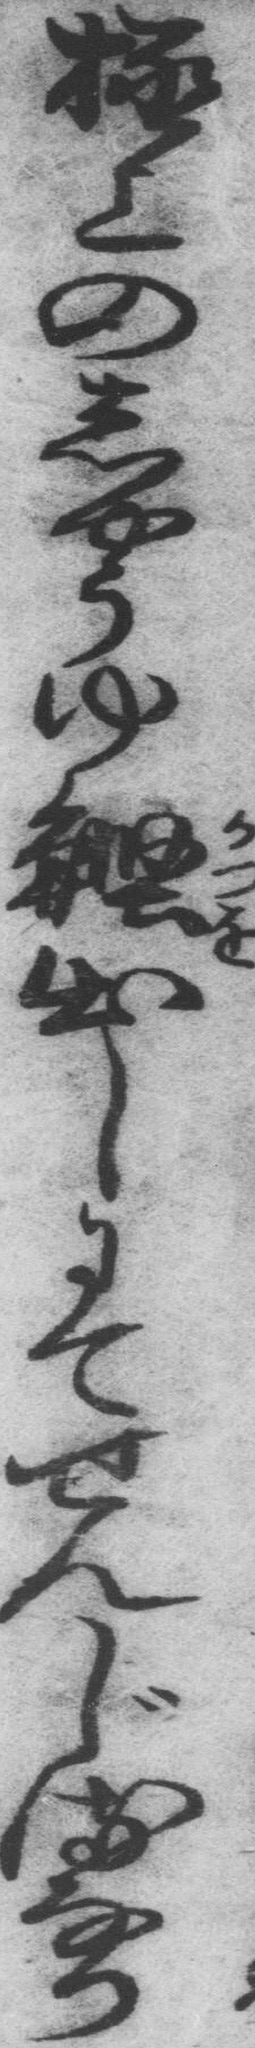極上のしやうゆ鰹出しにてせんじるなり
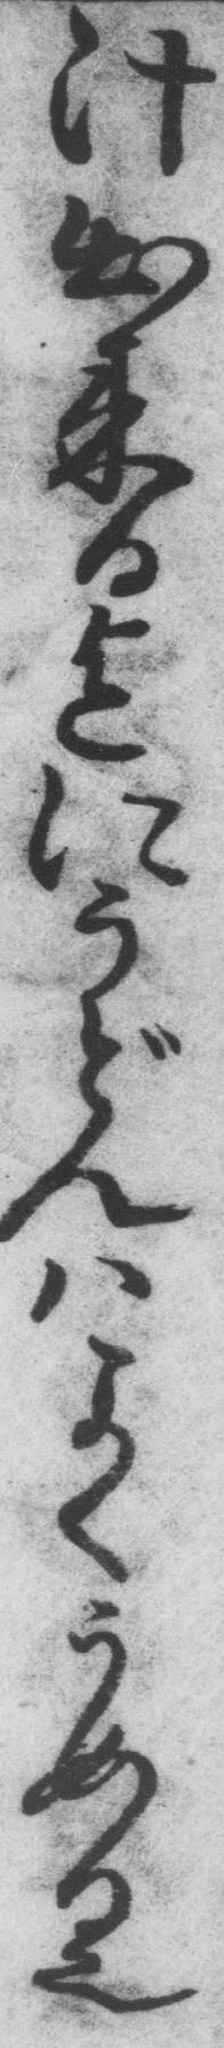汁出来る迄にうどんはよくうめる也
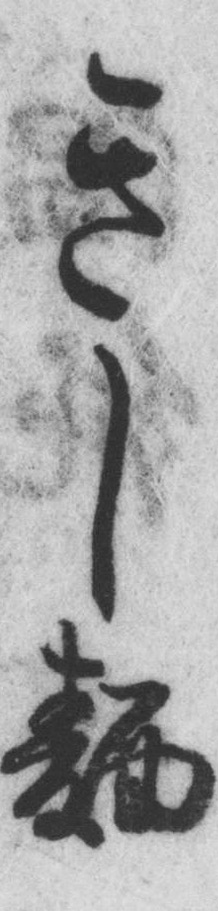きし麺
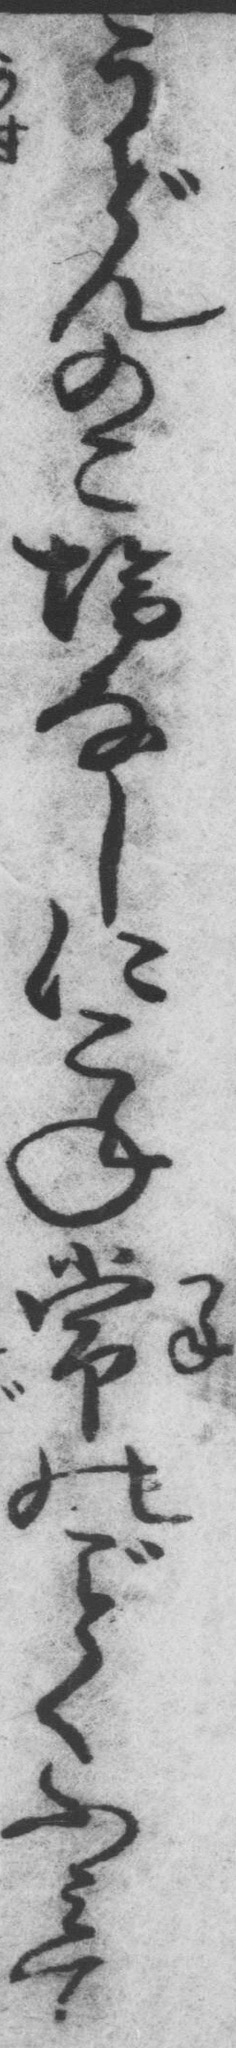うどんのこ塩なしにこね常のごとくふみて
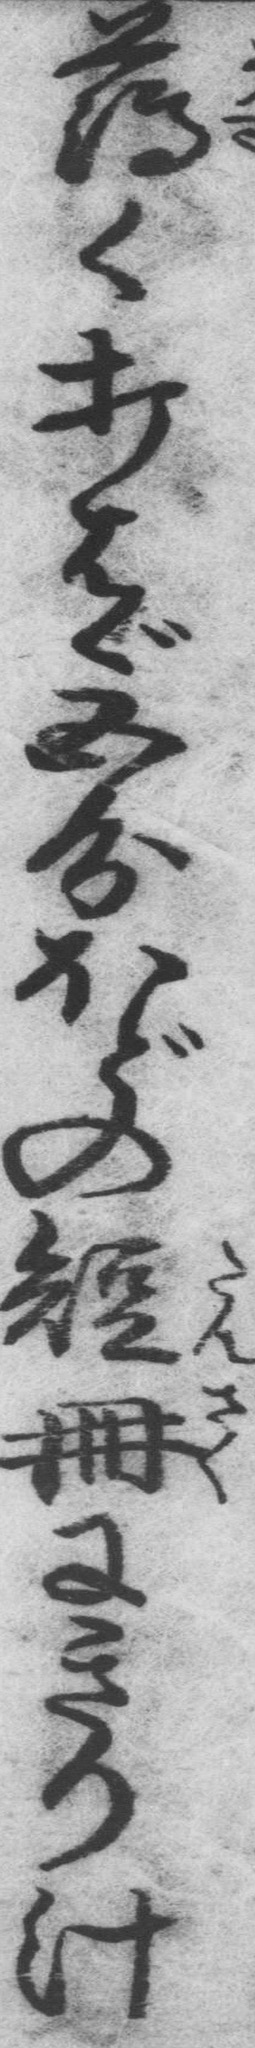薄く打はゞ五分ほどの短冊にきり汁
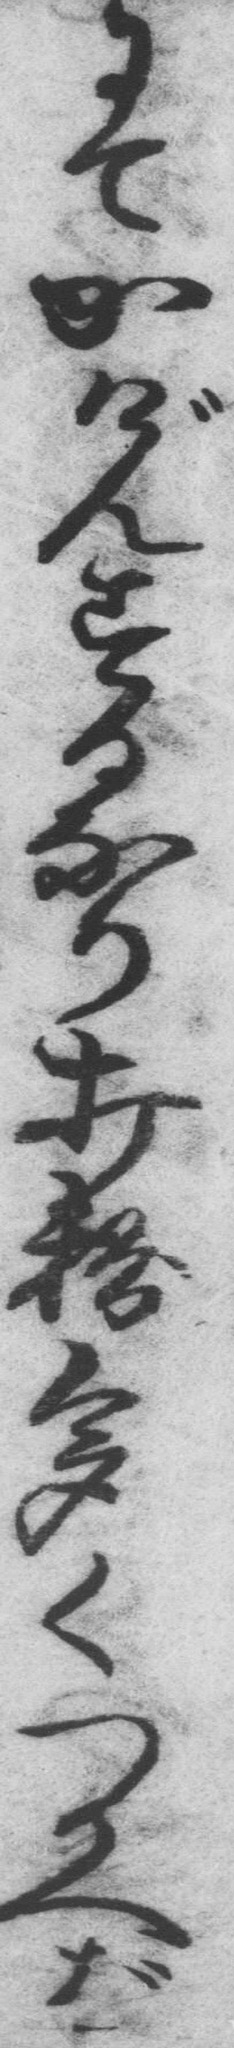にてかげんするなり打粉多くつかへば
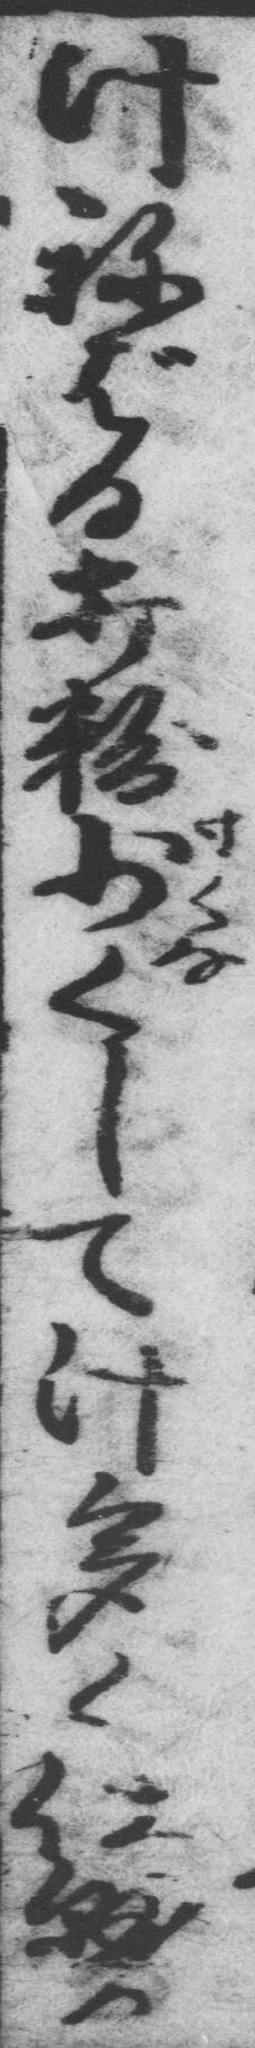汁ねばる打粉少くして汁多く仕懸る
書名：料理山海郷
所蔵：大阪府立大学学術情報センター 国文学研究資料館
